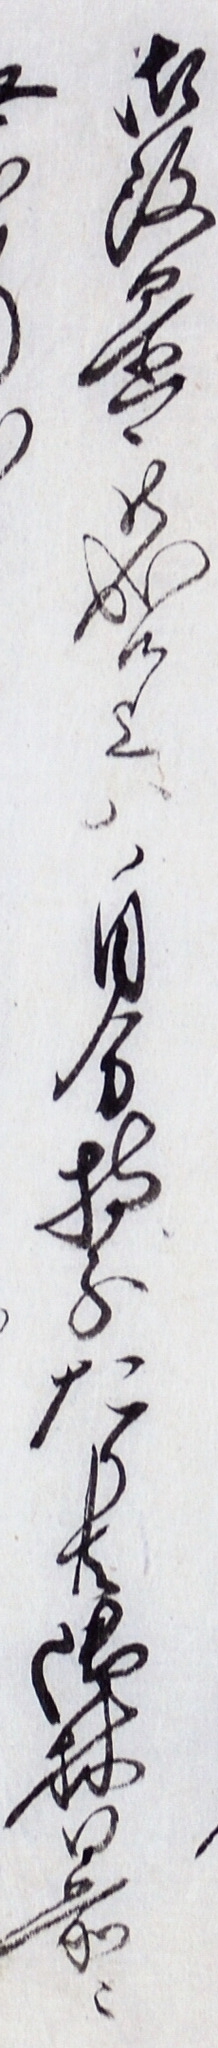御改置被成候上ハ自分持分たり共御林同前ニ
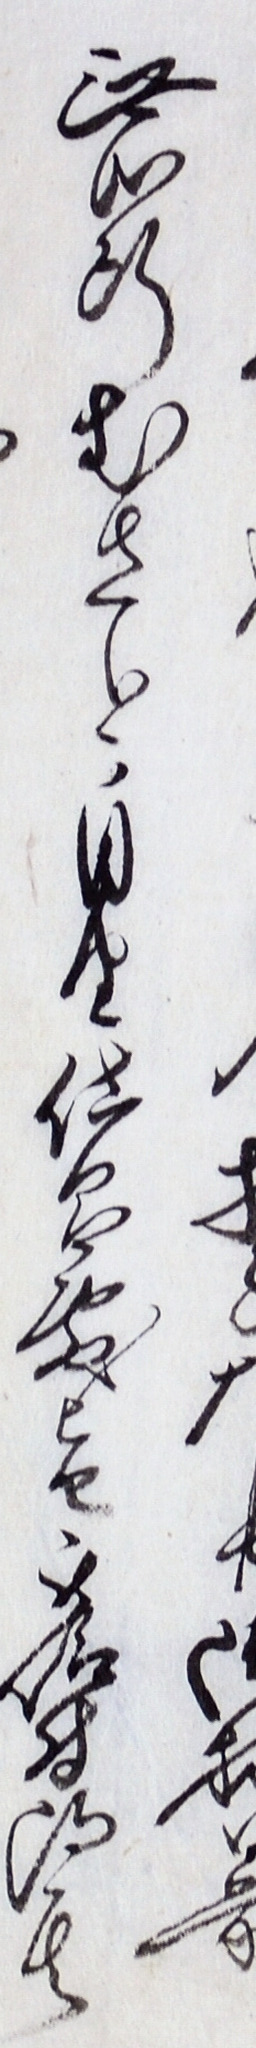無御断むさと自由仕間敷旨被仰付得其
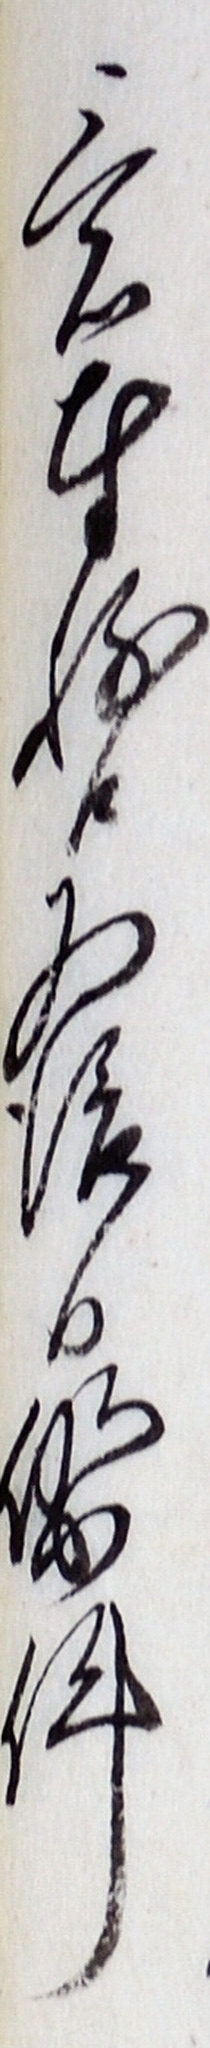意奉存候為後日仍如件
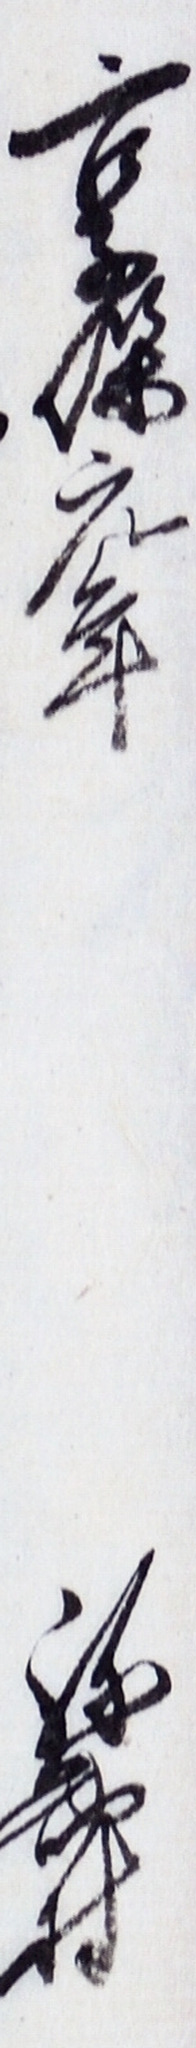享保元年弥勒村
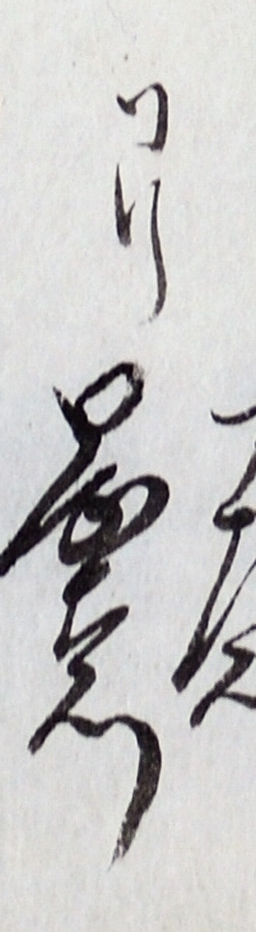同断岡右衛門
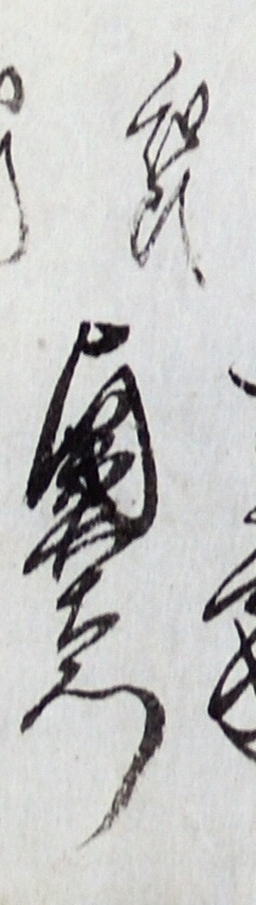同断岡右衛門

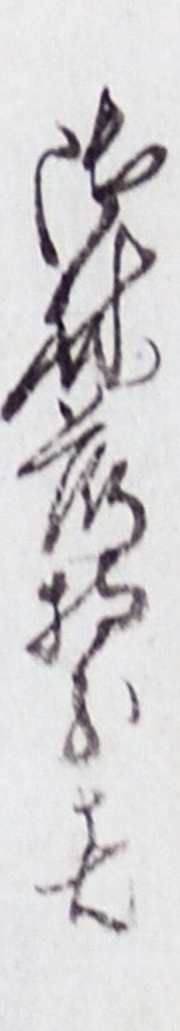御林薄持分者
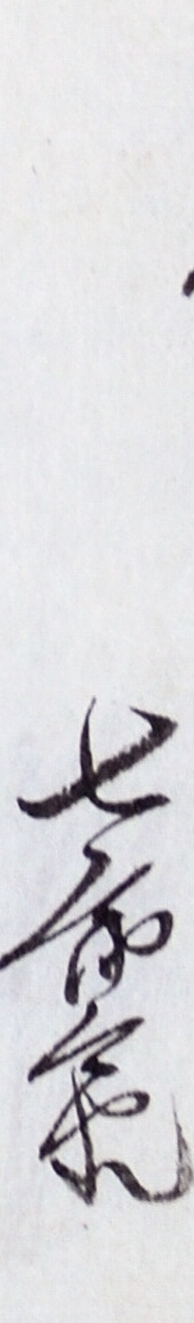七郎兵衛
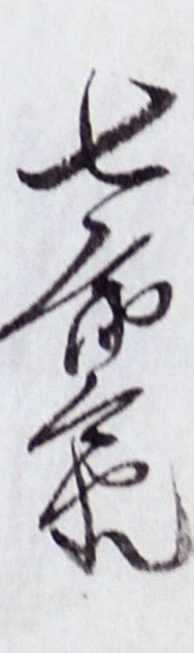七郎兵衛
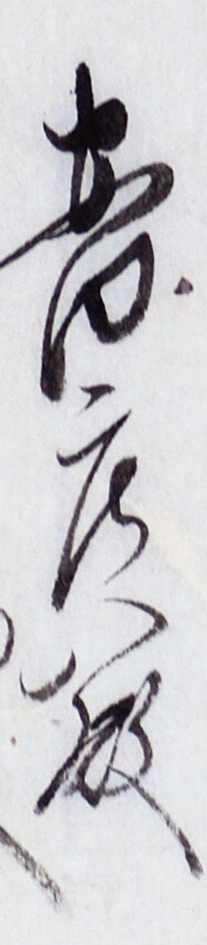安田庄八殿
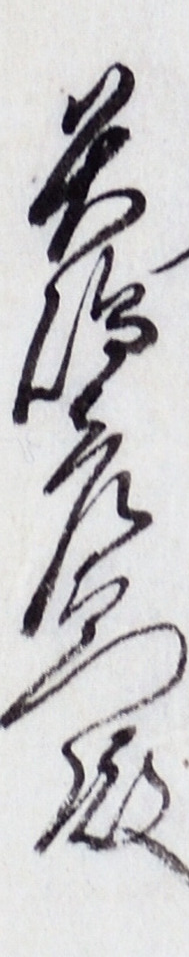矢嶋彦右衛門殿
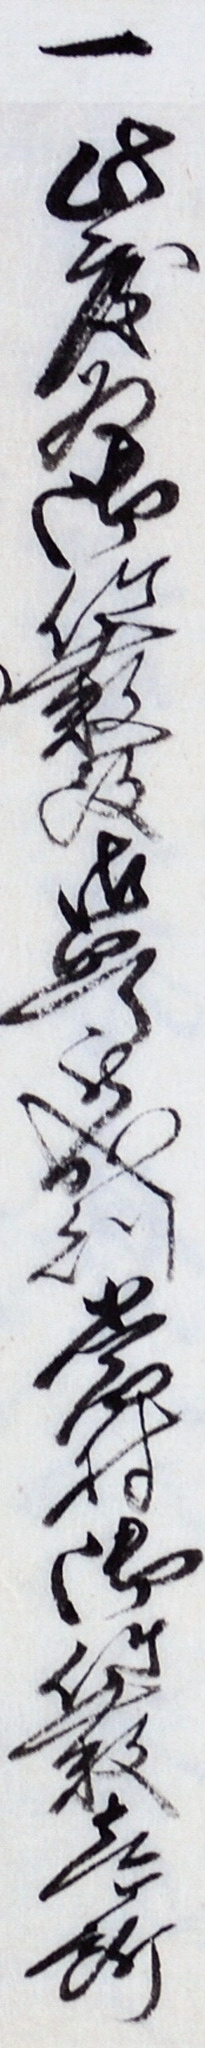一此度為御竹薮改御廻り被成則当村御竹薮壱ヶ所
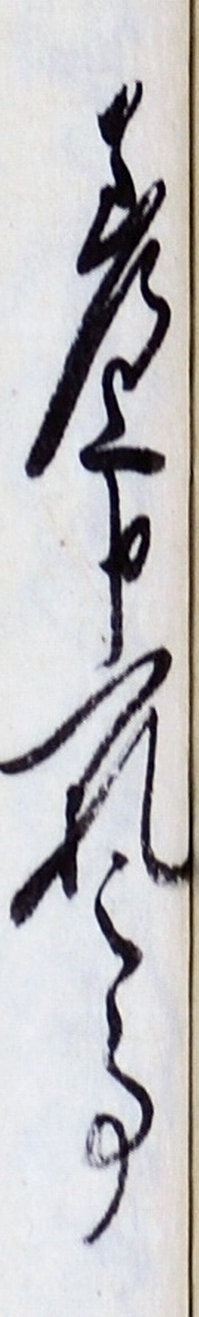差上申一札之事
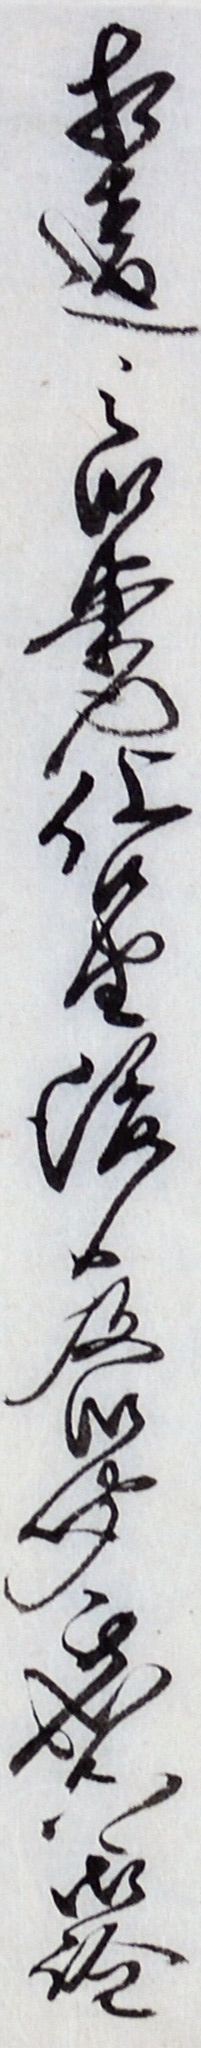相違之御案内仕候由後日及御聞被成候ハヽ御詮
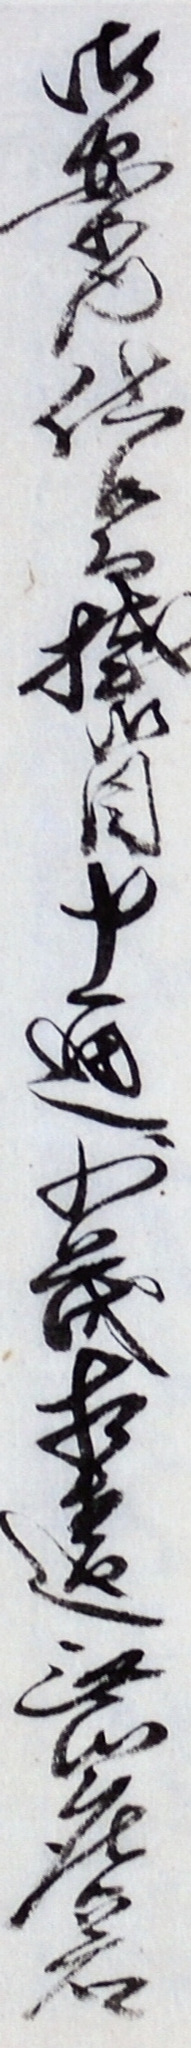御案内仕候而掛御目申通ニ少も相違無御座候若
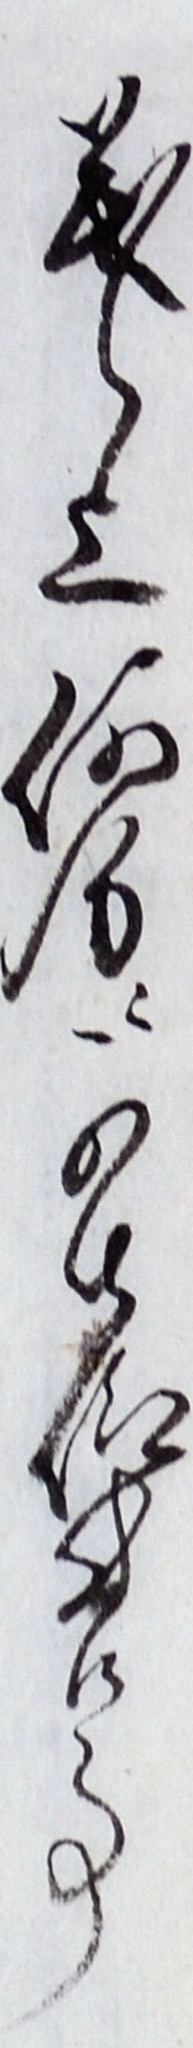義之上何分ニ可被仰付候事
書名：御林御竹藪証文控
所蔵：伊那市立高遠町図書館・合同会社AMANE
